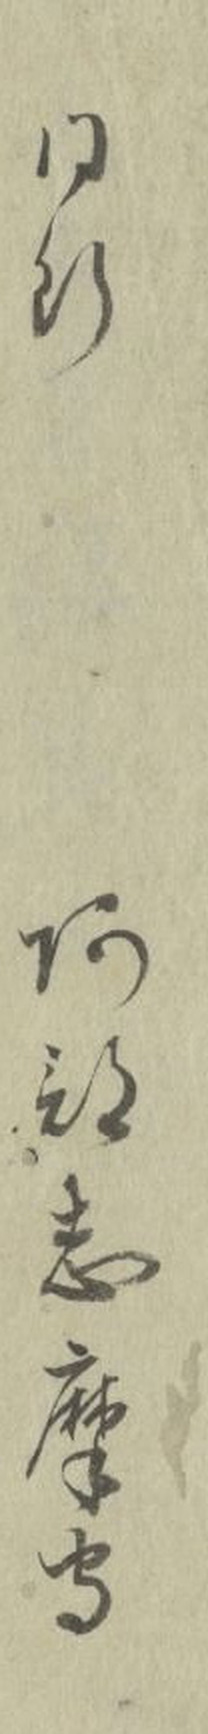同断阿部志摩守
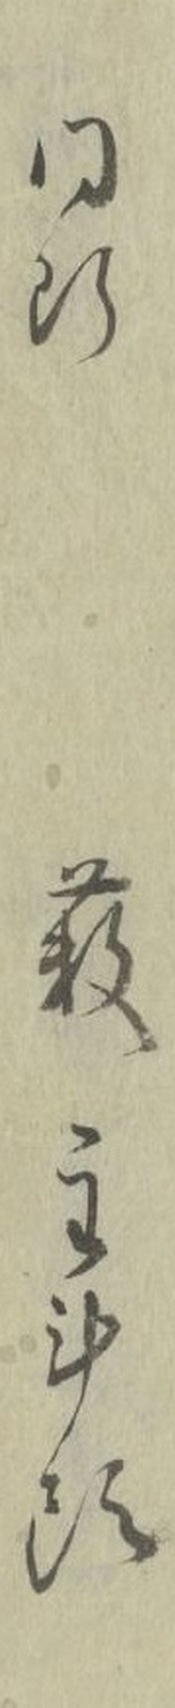同断藪主計頭
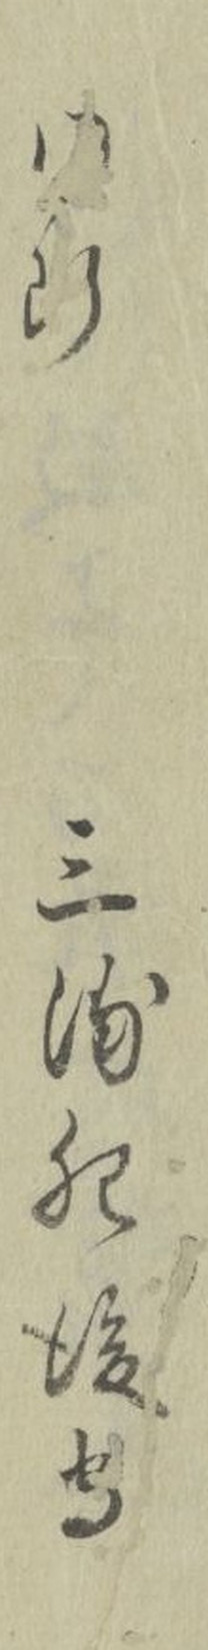同断三浦肥後守
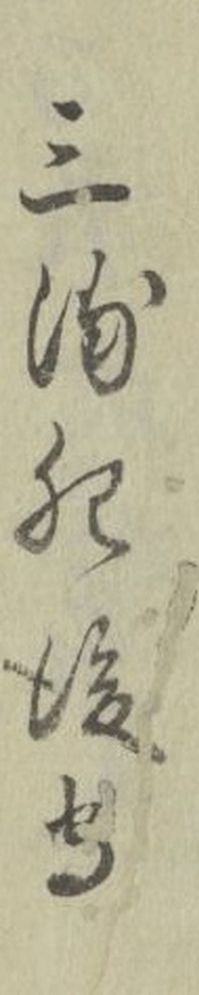同断三浦肥後守
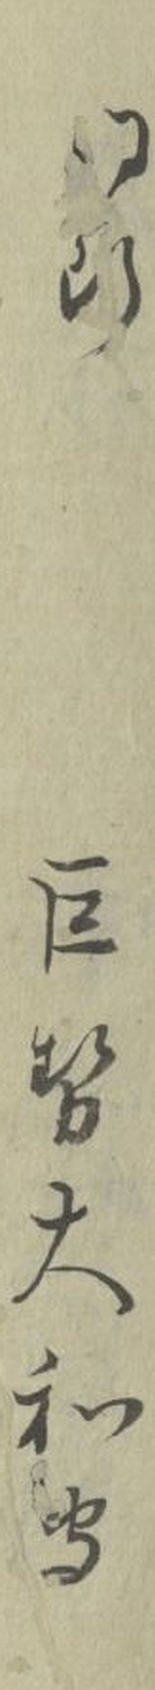同断巨勢大和守
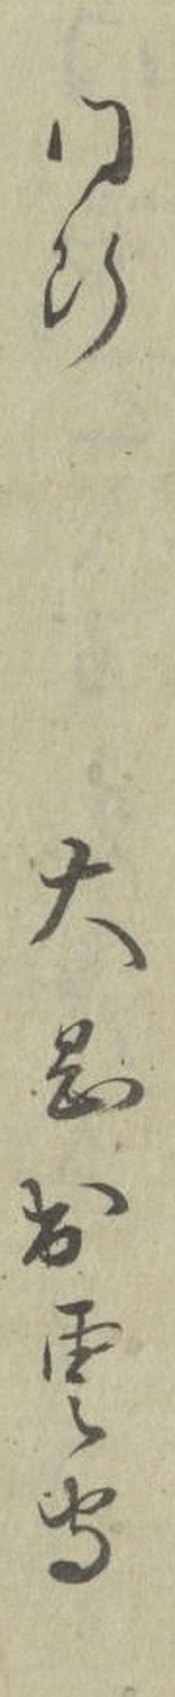同断大岡出雲守
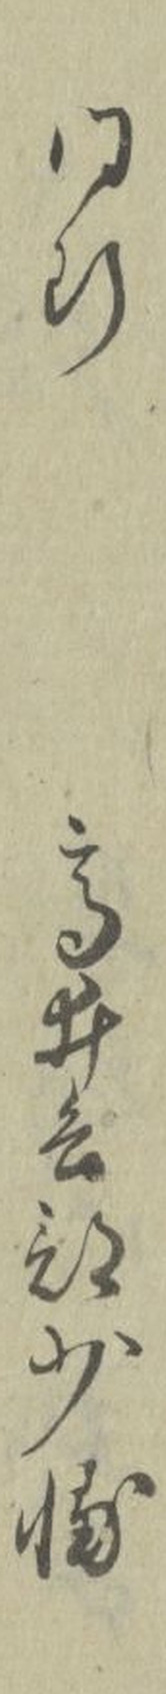同断高井兵部少輔
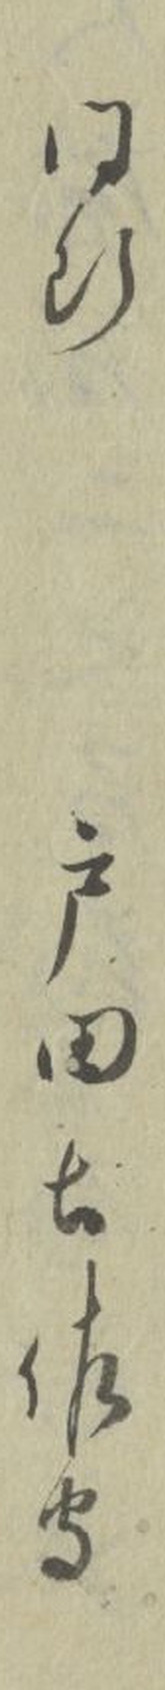同断戸田土佐守
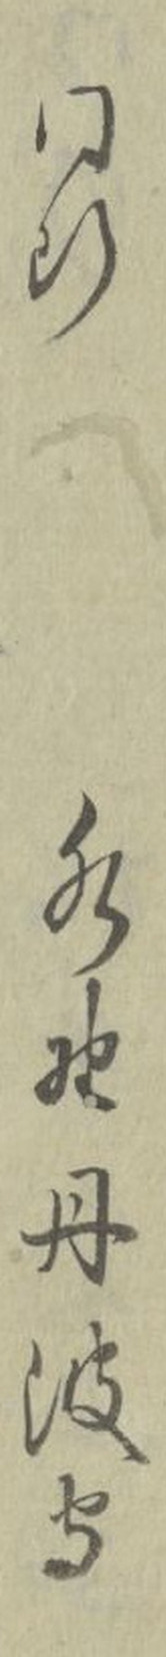同断水野丹波守
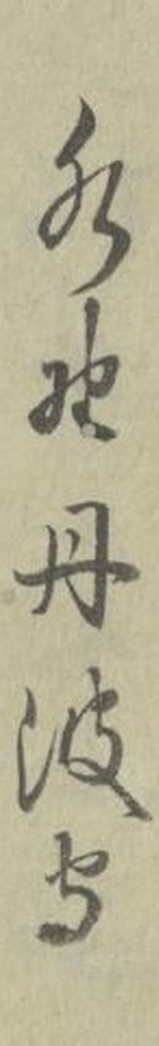同断水野丹波守

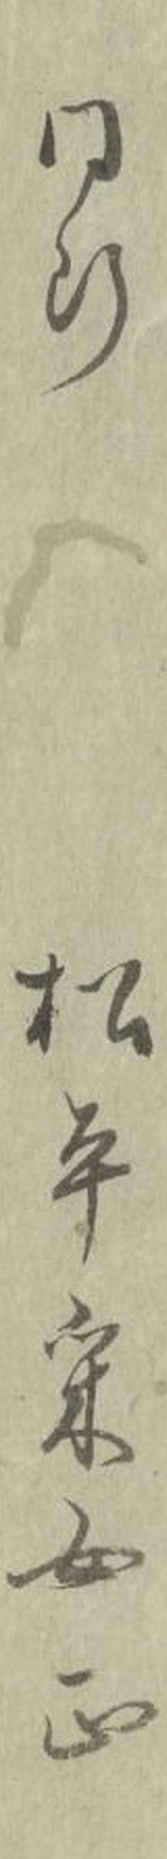同断松平采女正
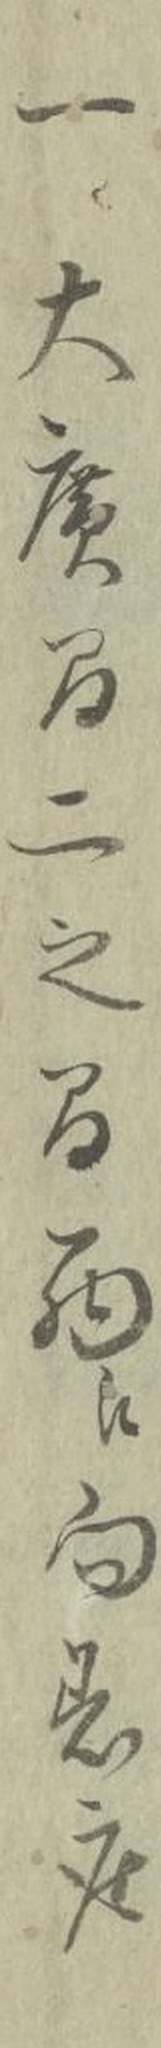一大広間二之間西え向着座
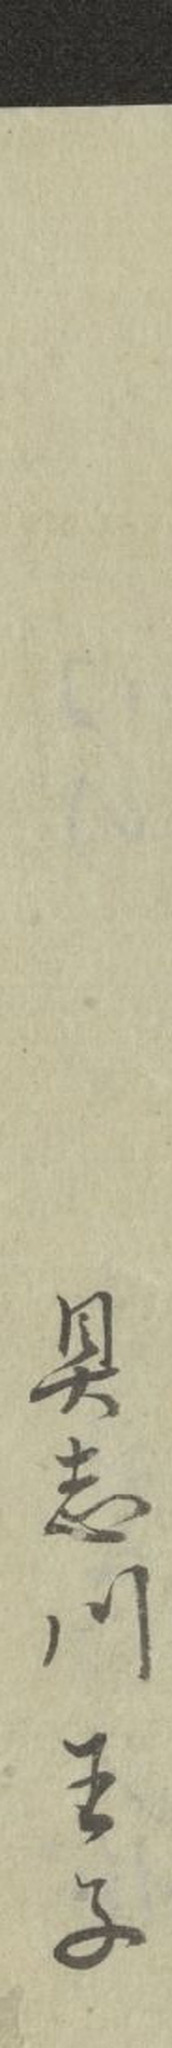具志川王子
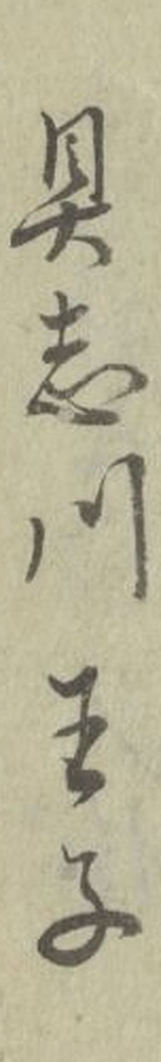具志川王子
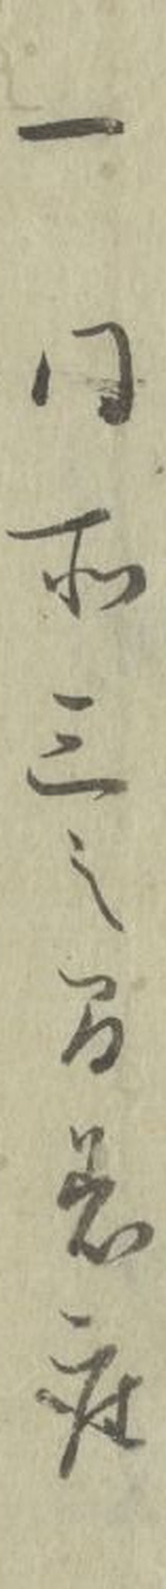一同所三之間着座
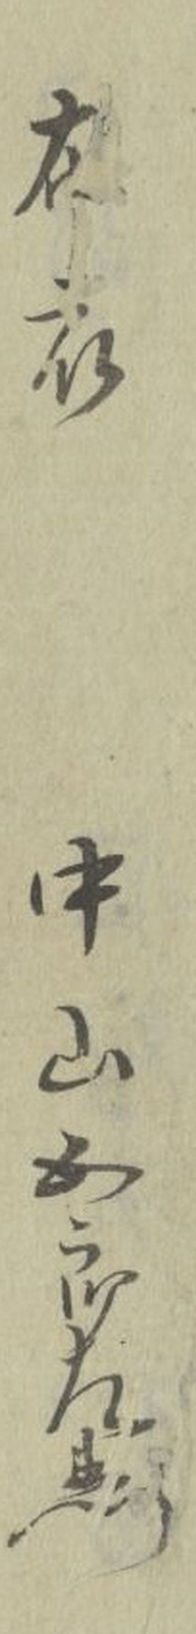布衣中山五郎左衛門
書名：琉球来朝記 自八至十四終
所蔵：University of the Ryukyus Library
